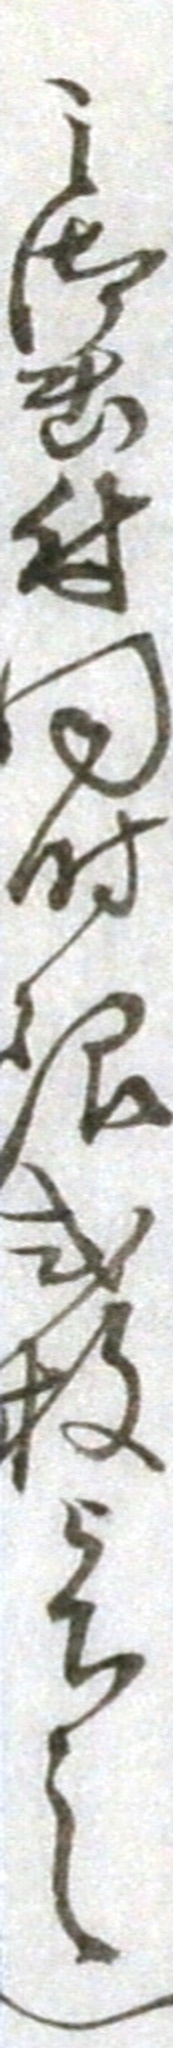之御書付同時限式数被下之
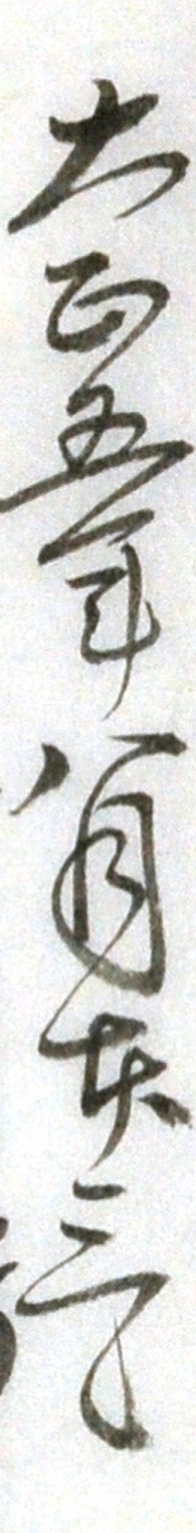大正五年八月廿三日
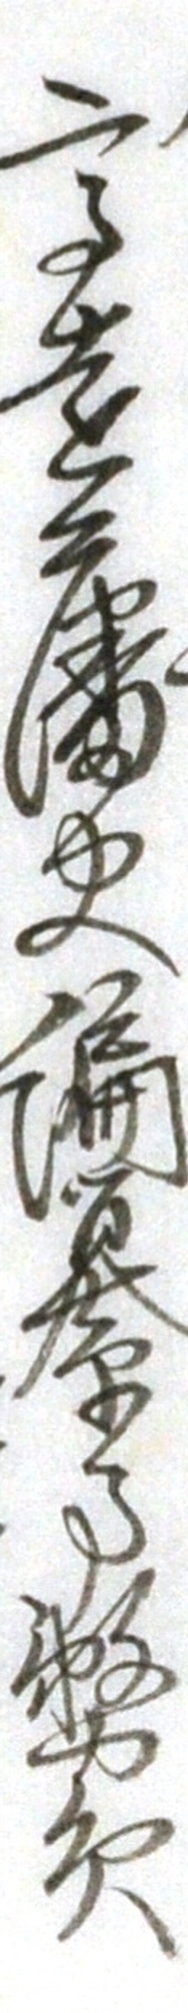高遠藩史編纂事務員
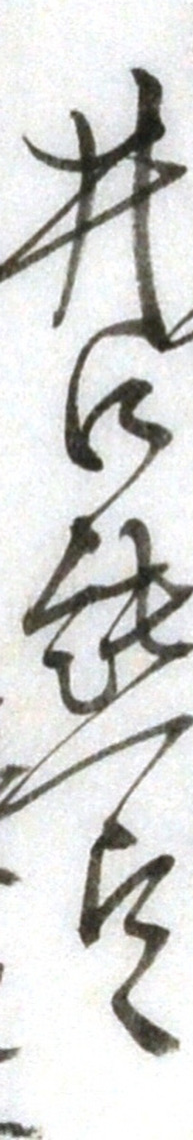井口純一郎
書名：隠居之願并隠居御聞届嗣子家督被仰付候御書付
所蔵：伊那市立高遠町図書館・合同会社AMANE
